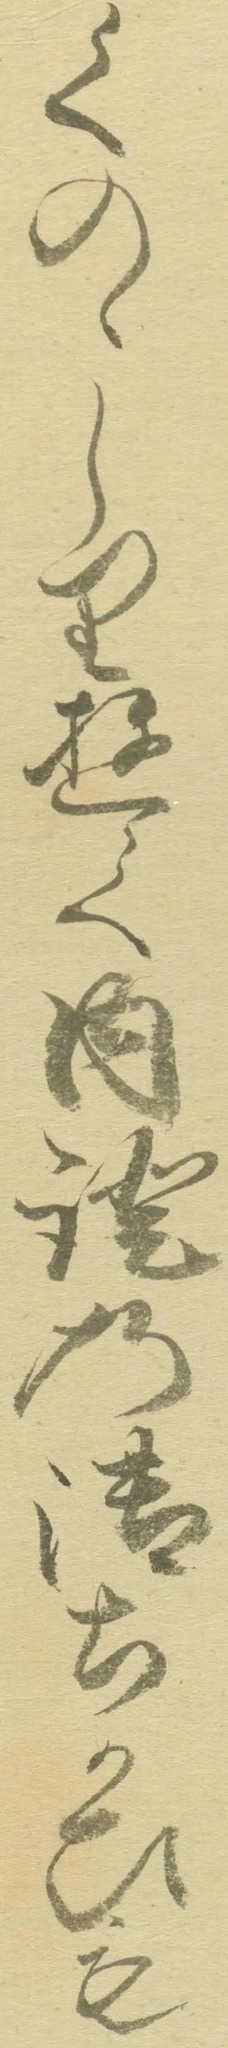くのゝしりゆく内證の御ちかひも
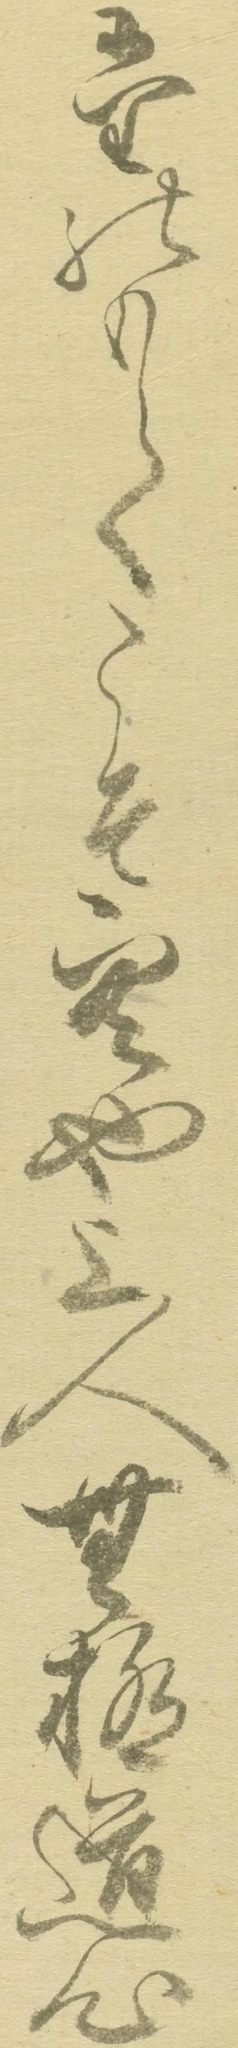たのもしくこそ空や上人無極道心
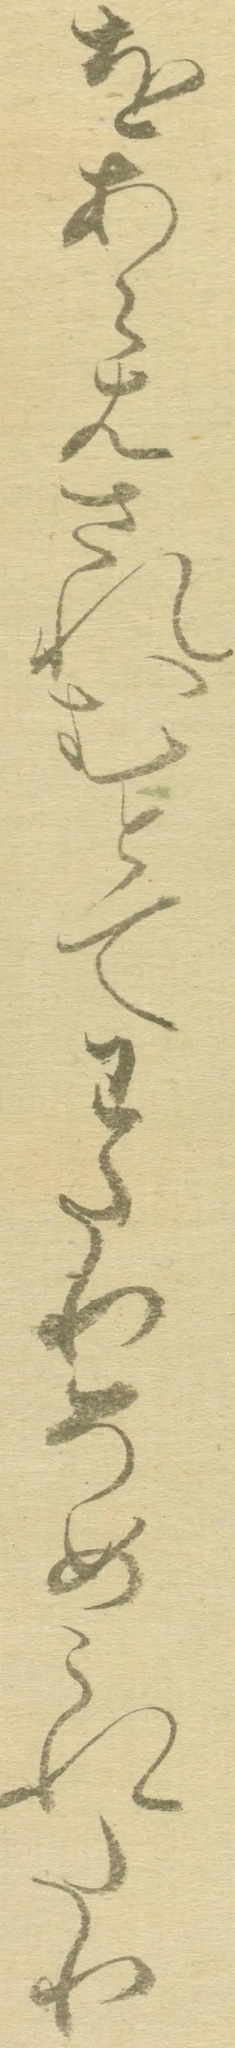をあらはされむとてわたりそめられたり
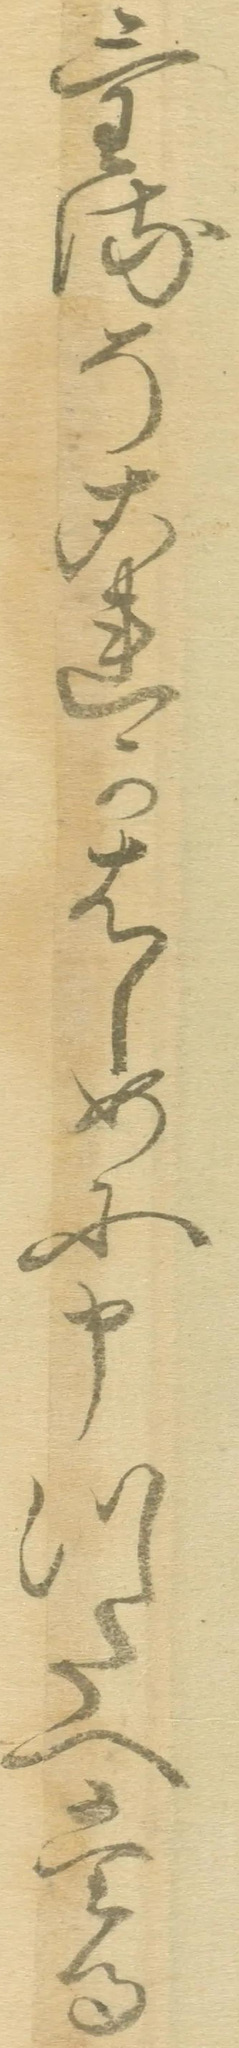けるそこれかはしめに申つたへたる
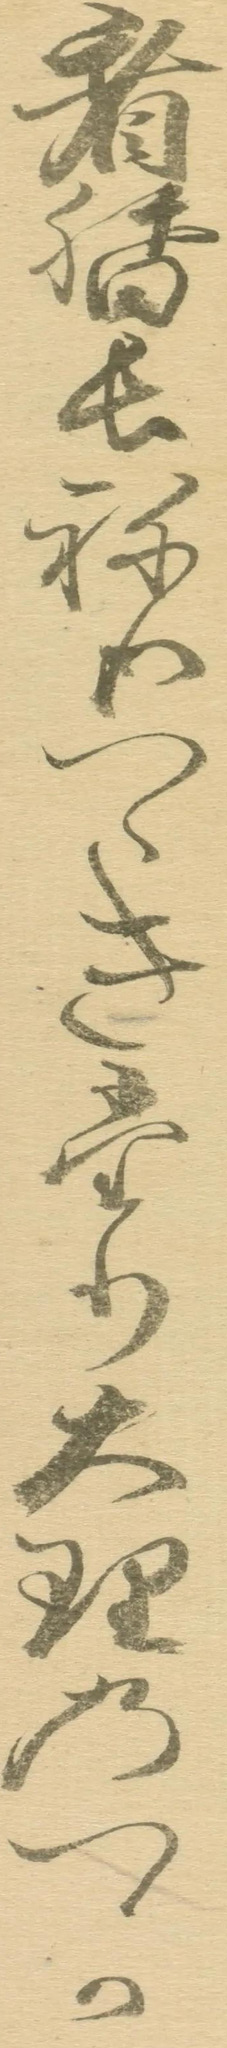看督長ねりつゝきたり大理のつか
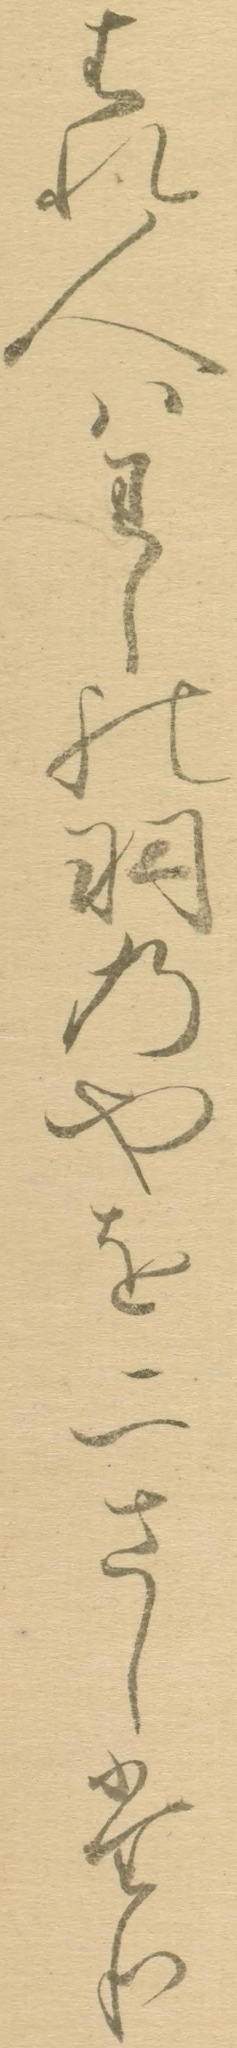はれ人はわしの羽のやを二さしたり
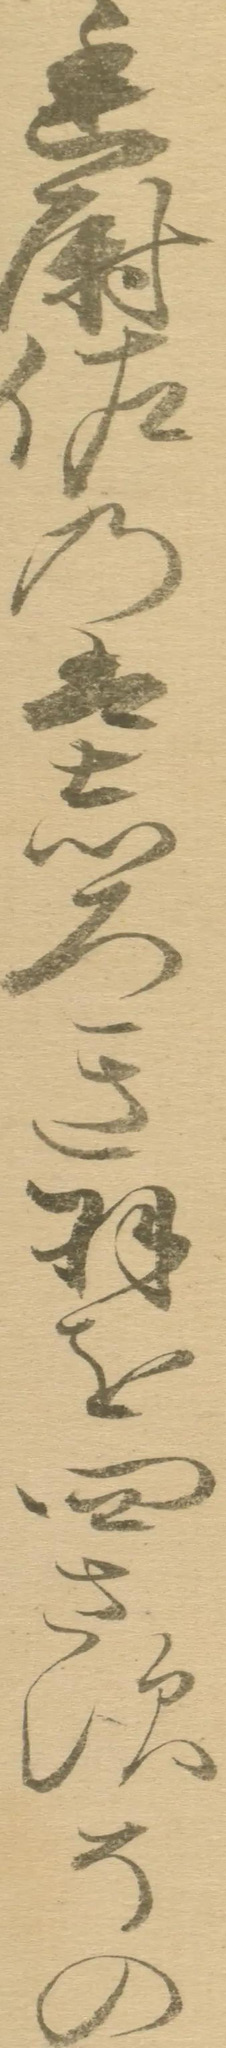廷尉佐のはしろき羽を四さすその

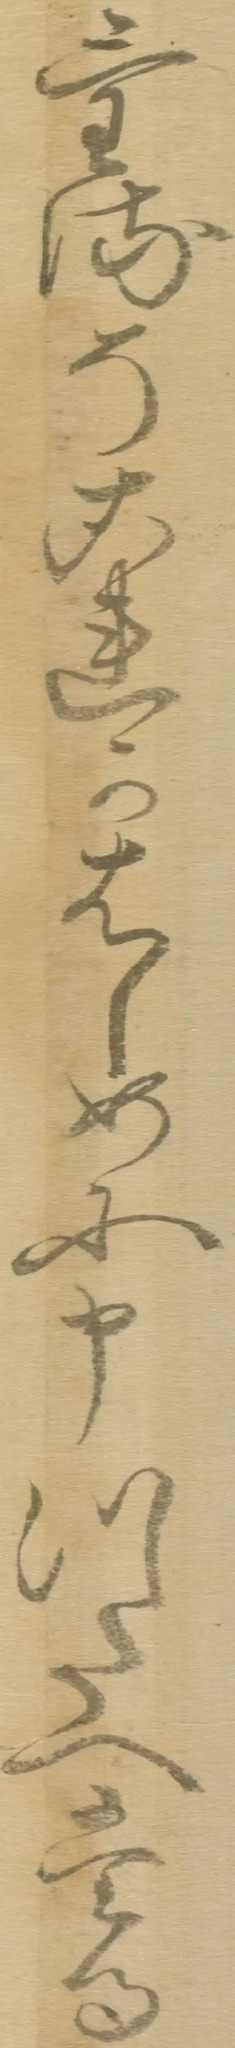けるそこれかはしめに申つたへたる
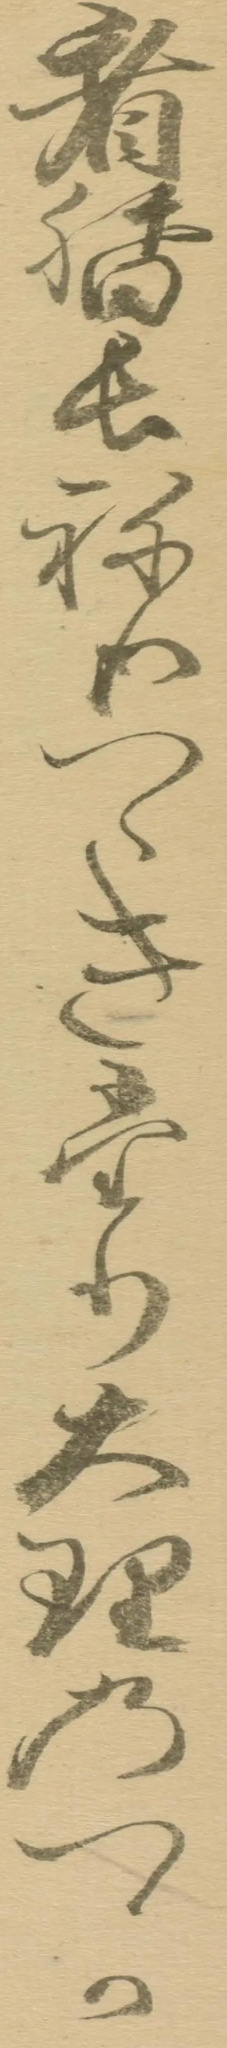看督長ねりつゝきたり大理のつか
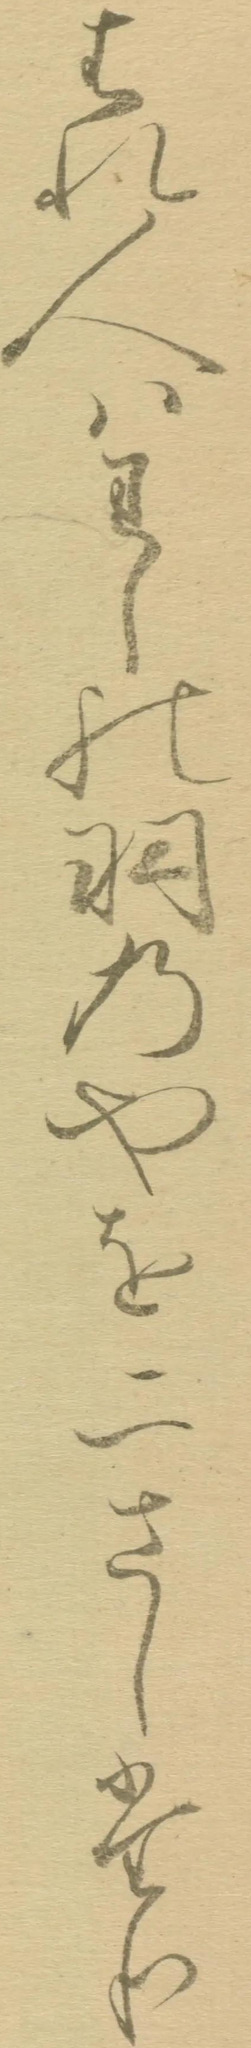はれ人はわしの羽のやを二さしたり
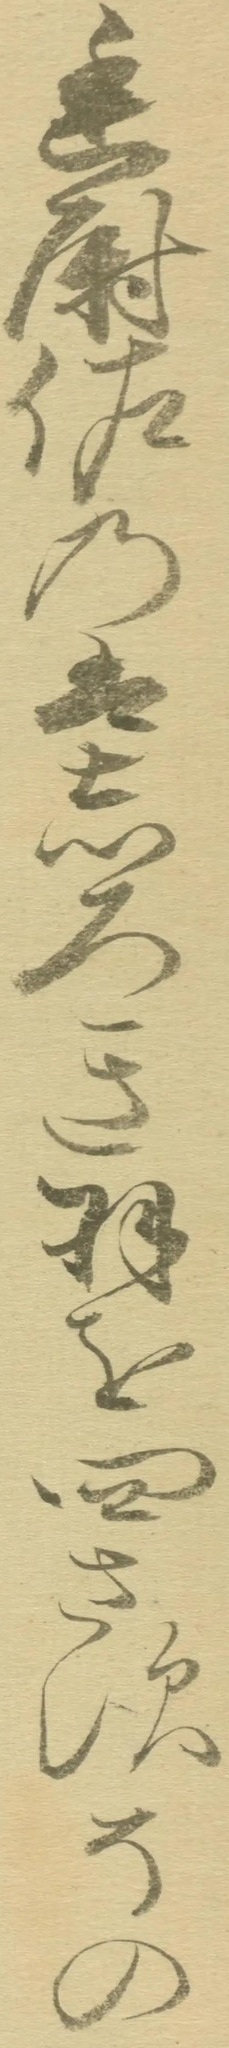廷尉佐のはしろき羽を四さすその
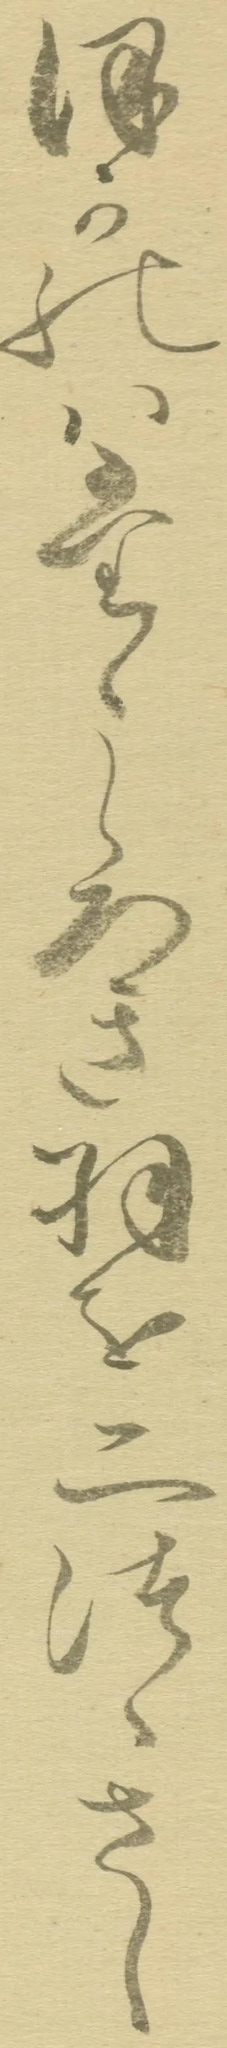ほかのはたゝしろき羽を二つゝさし
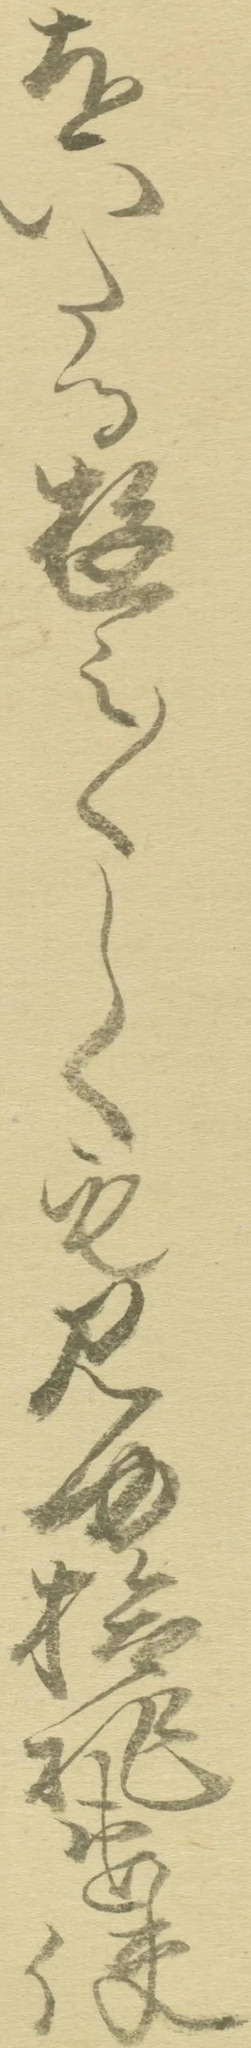をいたるゆえ〳〵しくも見ゆ撿非違使
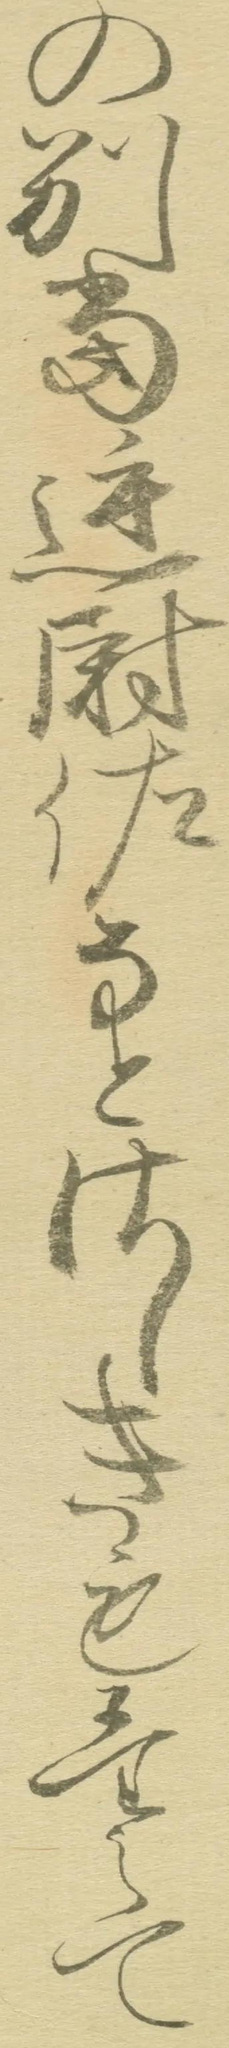の別当廷尉佐なとさしきもたえて
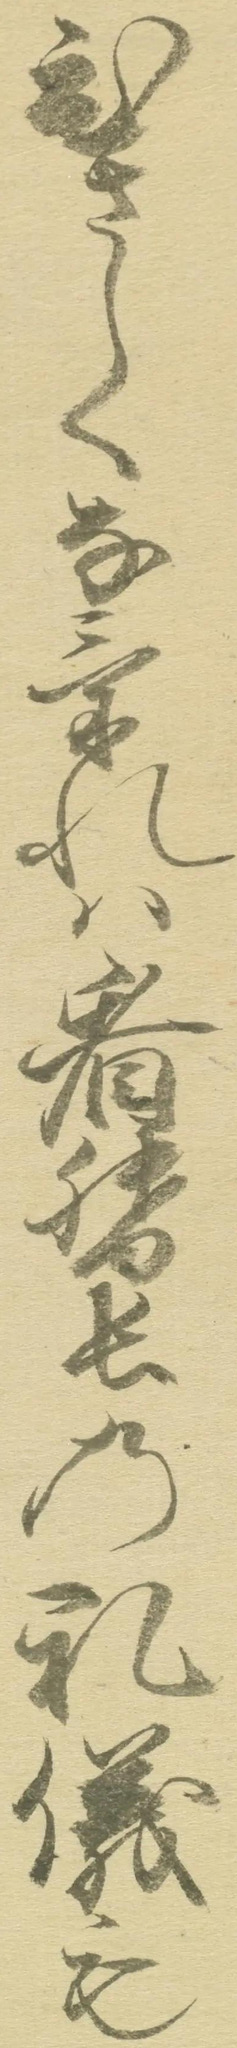ひさしくなけれは看督長の礼儀も
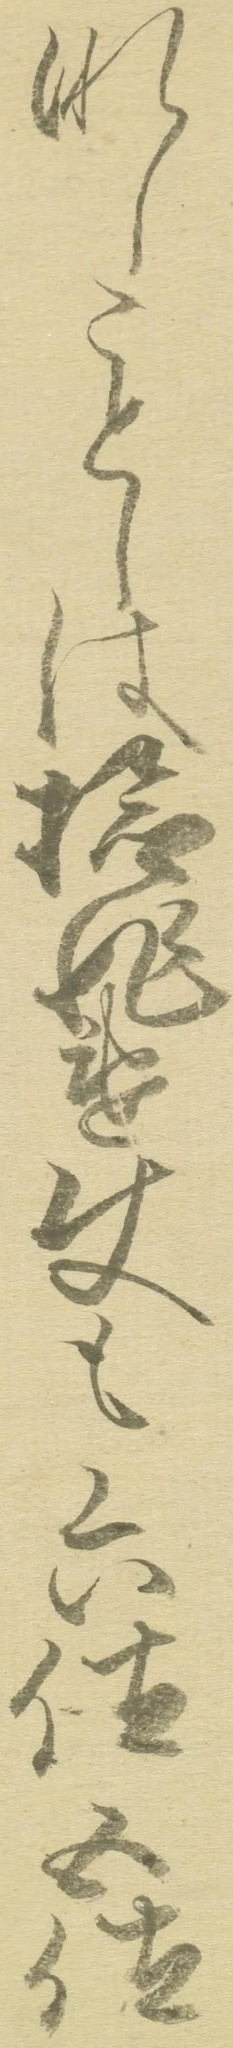なしことしは撿非違使も六位五位
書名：賀茂祭縁起
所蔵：国立国会図書館 National Diet Library, JAPAN
